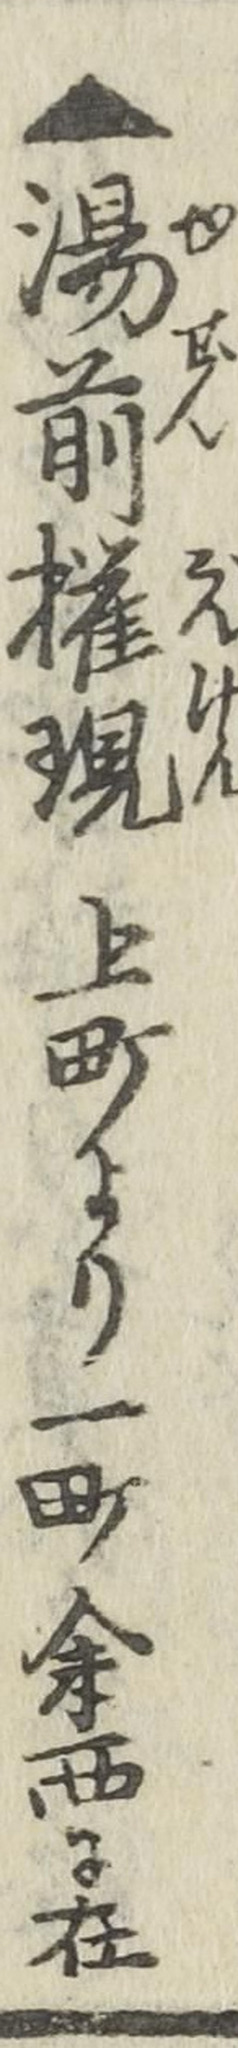▲湯前権現上町より一町余西に在
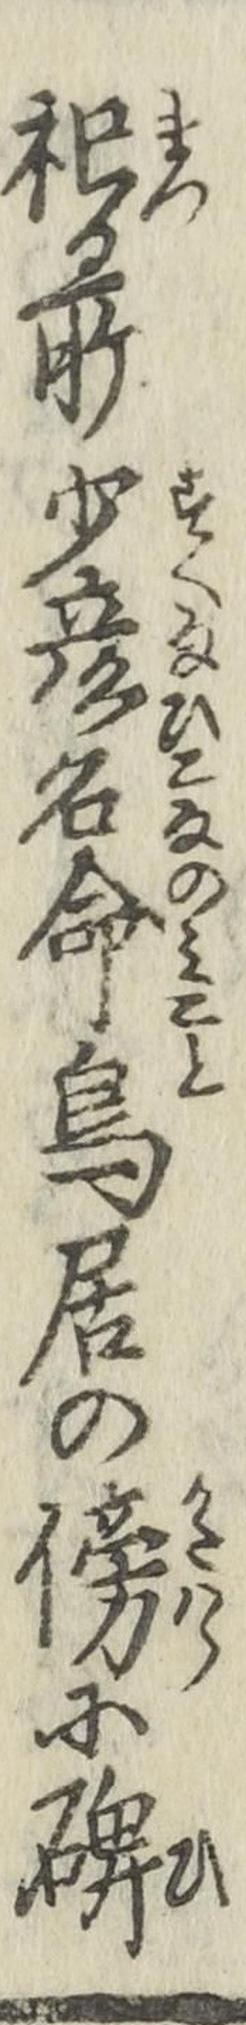祀る所少彦名命鳥居の傍に碑
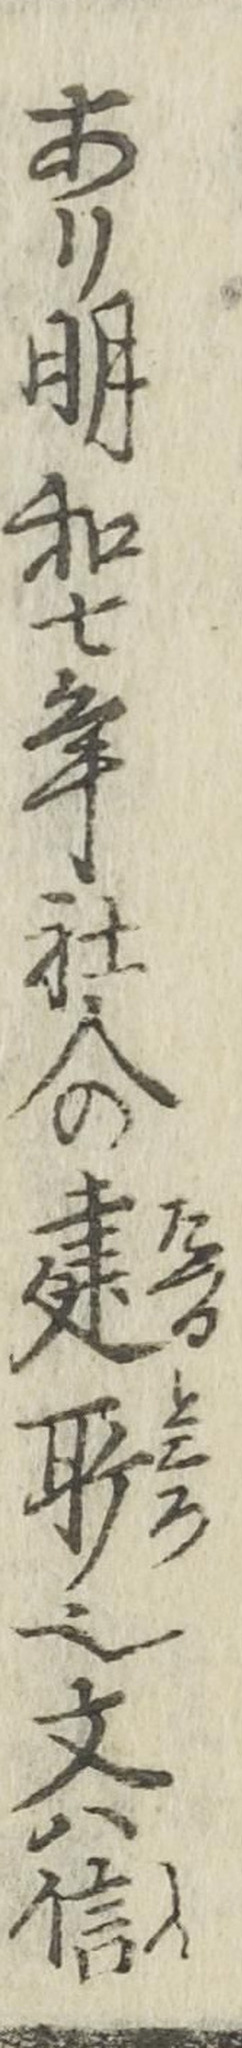あり明和七年社人の建所也文は信
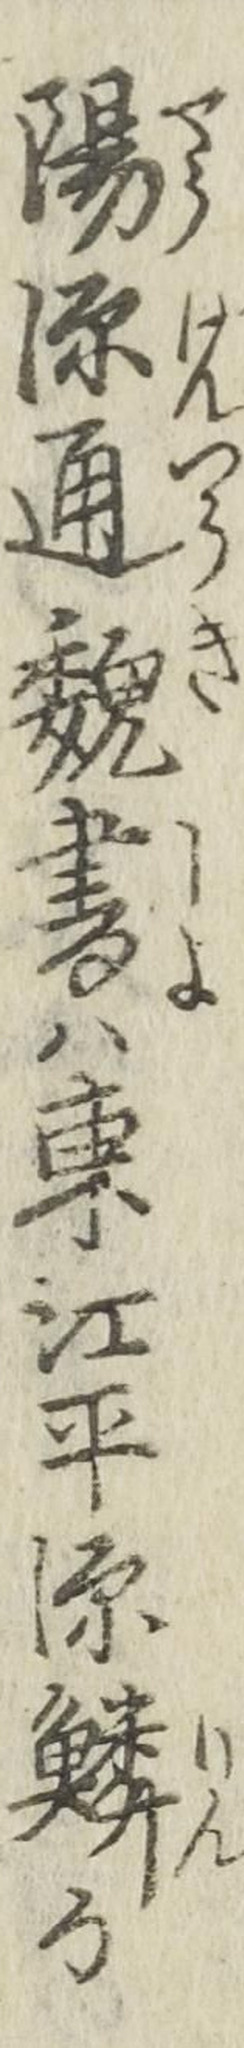陽源通魏書は東江平源鱗にて
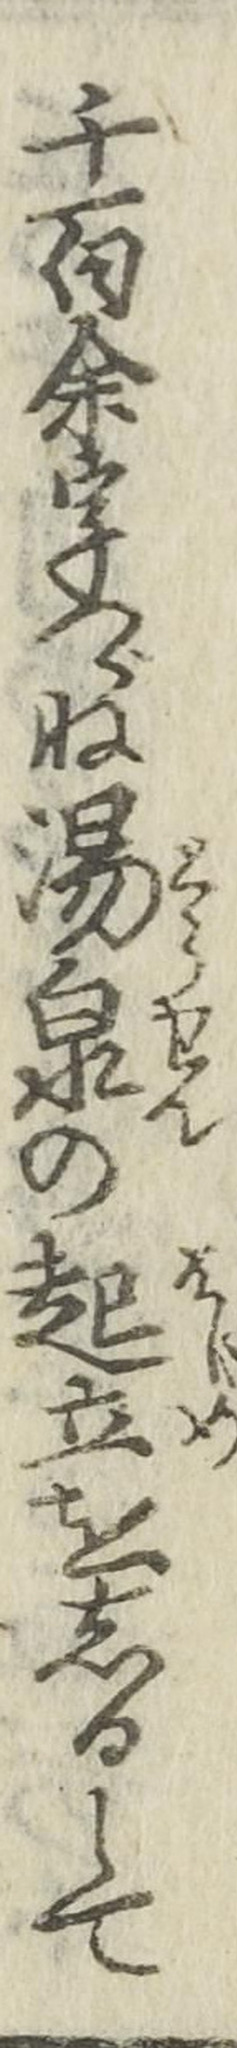千百余字つらね湯泉の起立をしるして
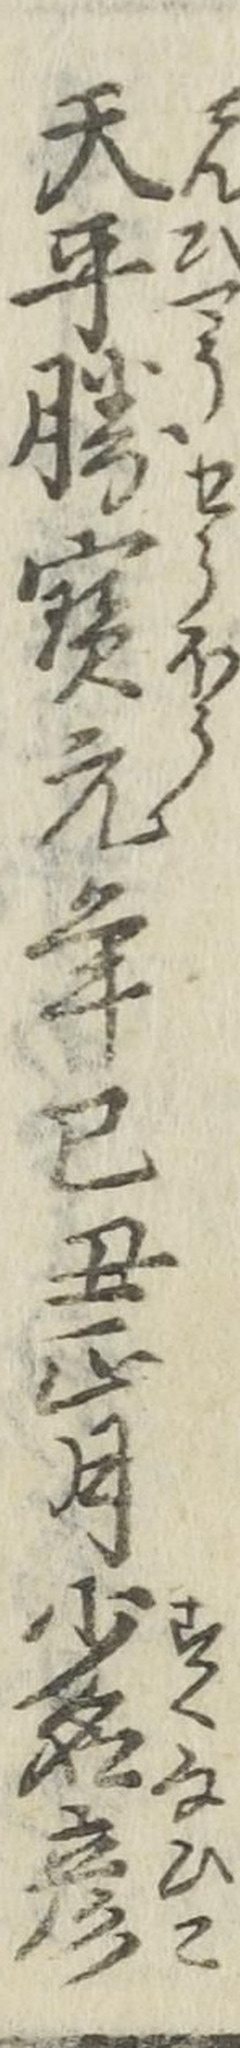天平勝宝元年己丑正月少名彦
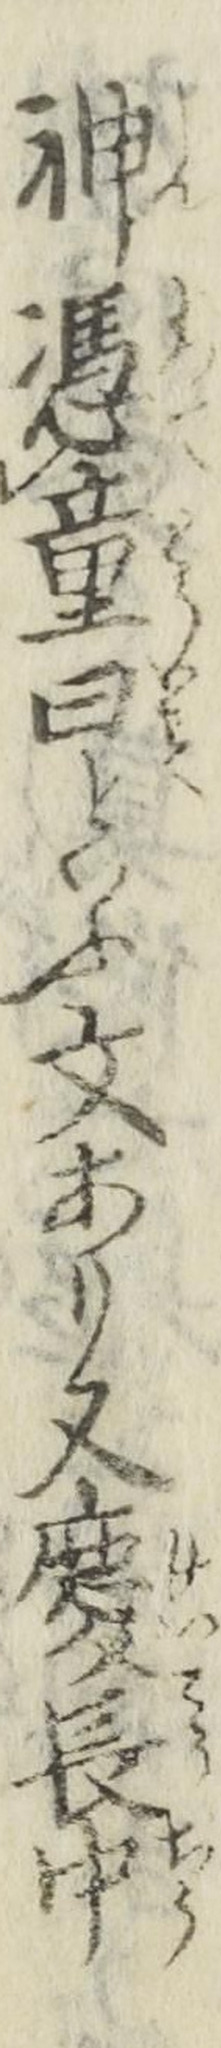神憑童曰といふ文あり又慶長中
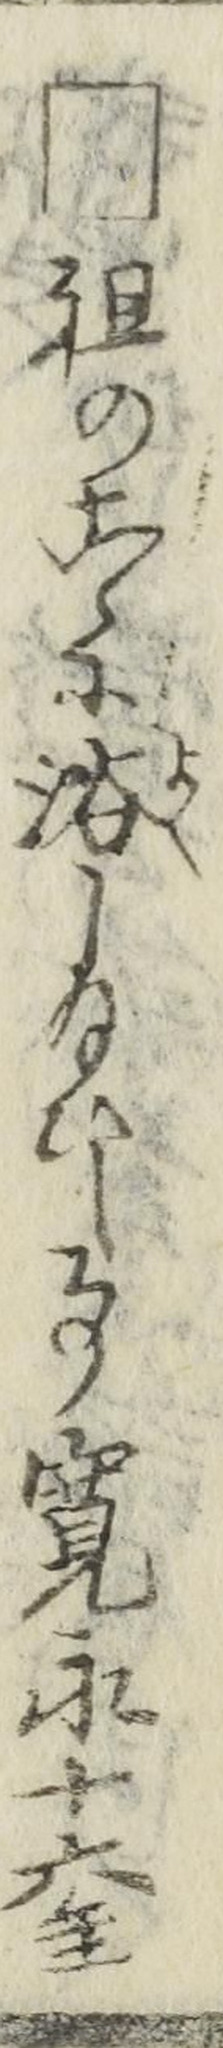祖のこゝに浴し給ひし事寛永十六年
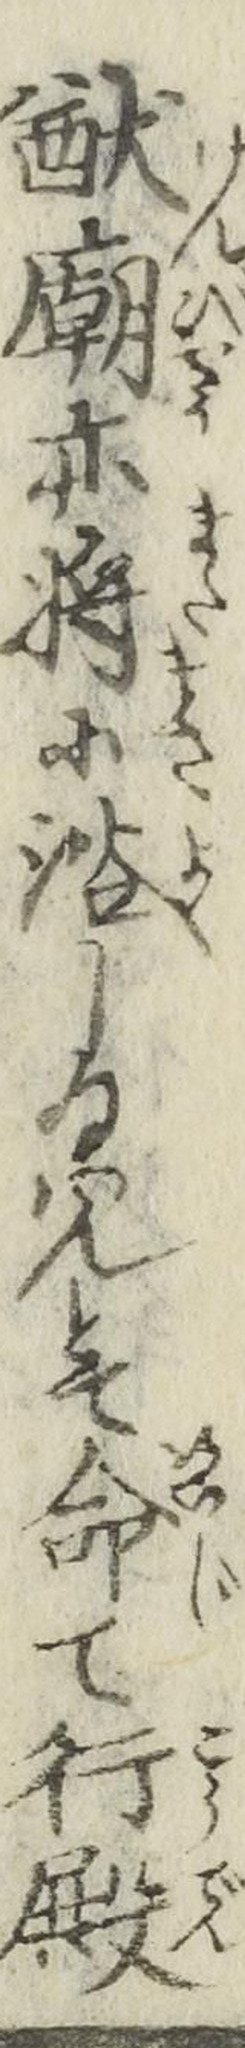猷廟亦将に浴し給はんとて命て行殿
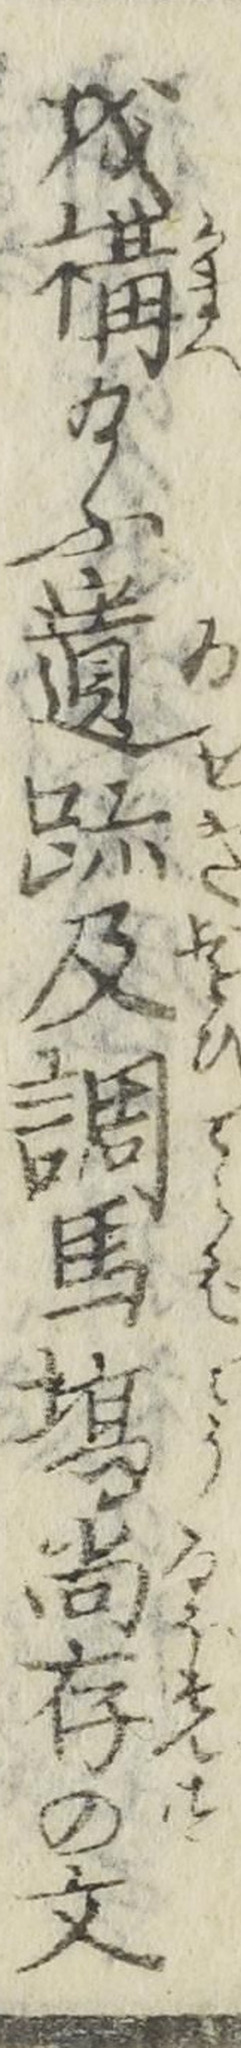を構給ふ遺跡及調馬場尚存の文
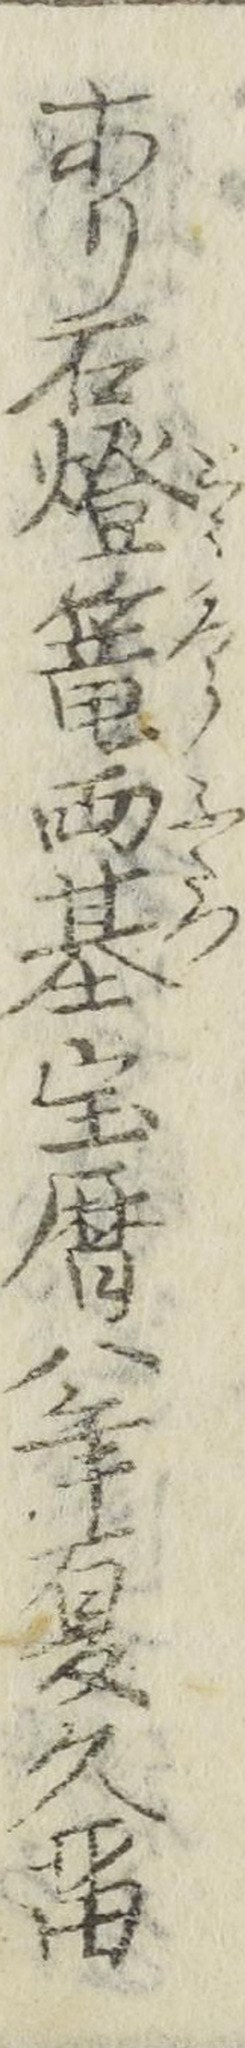あり石燈篭両基宝暦八年夏久留
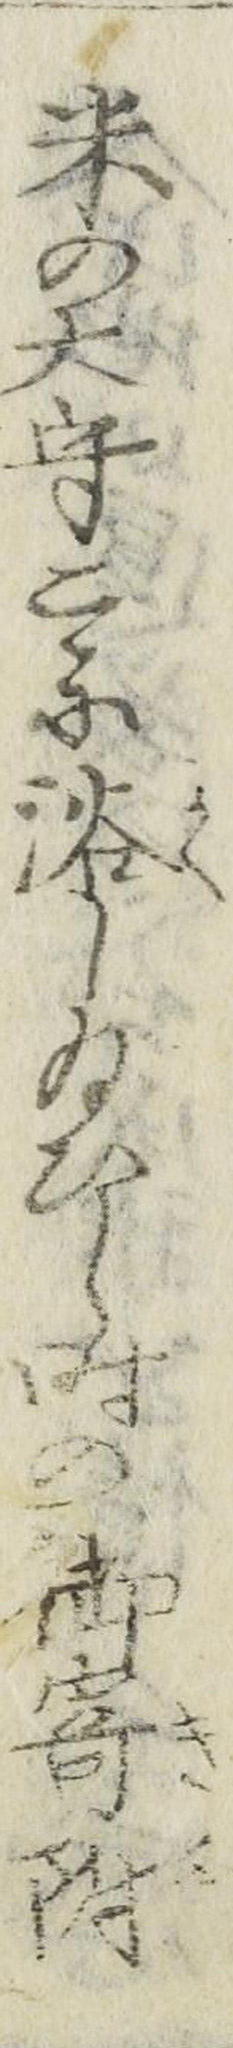米の太守こゝに浴し給ひし時の御寄附
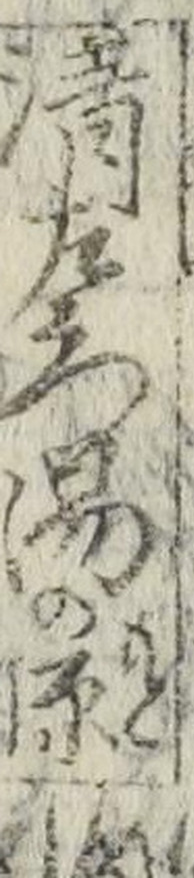清左エ門湯の源
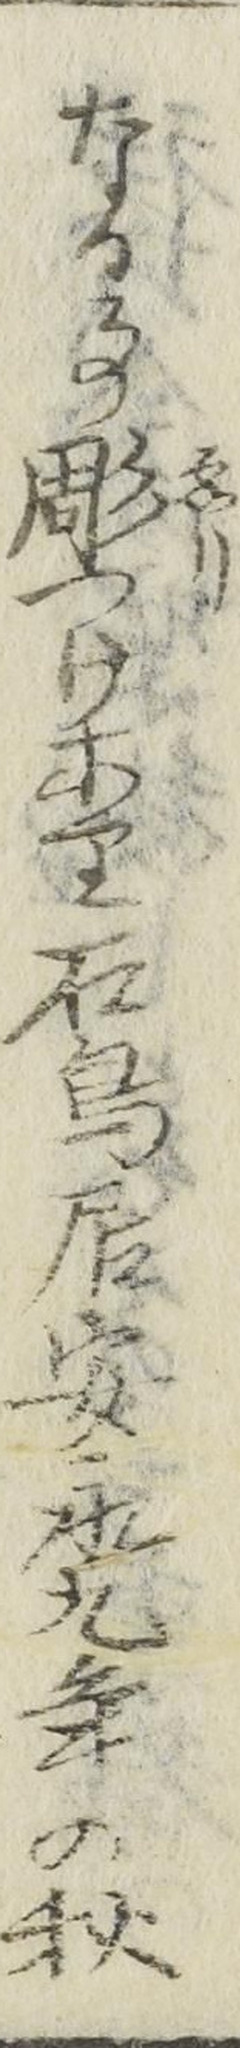なる事彫つけあり石鳥居安永九年の秋
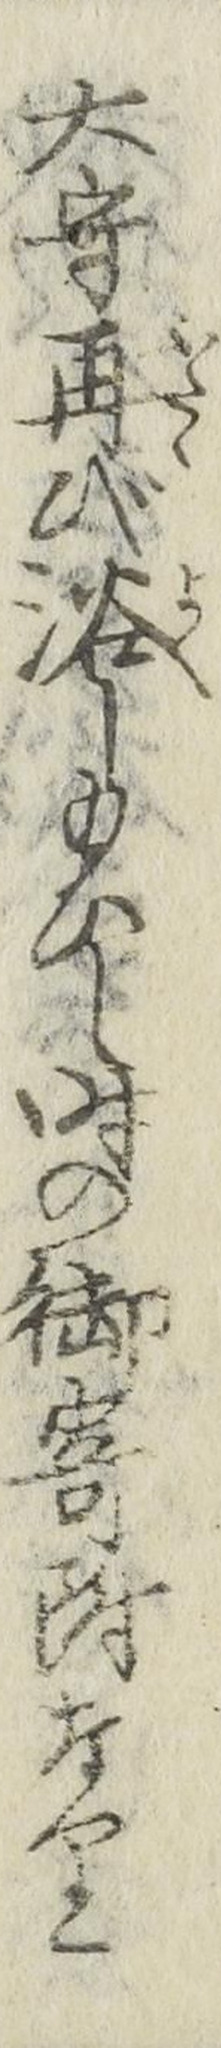太守再び浴し給ひし時の御寄附なり
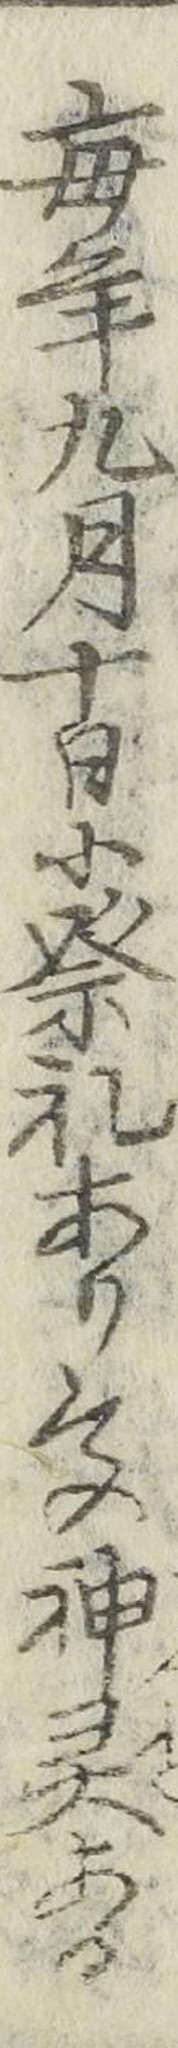毎年九月十日に祭礼ありその神霊ある
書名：熱海温泉圖彙
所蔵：東京大学地震研究所図書室 Earthquake Research Institute Library, The University of Tokyo, JAPAN
